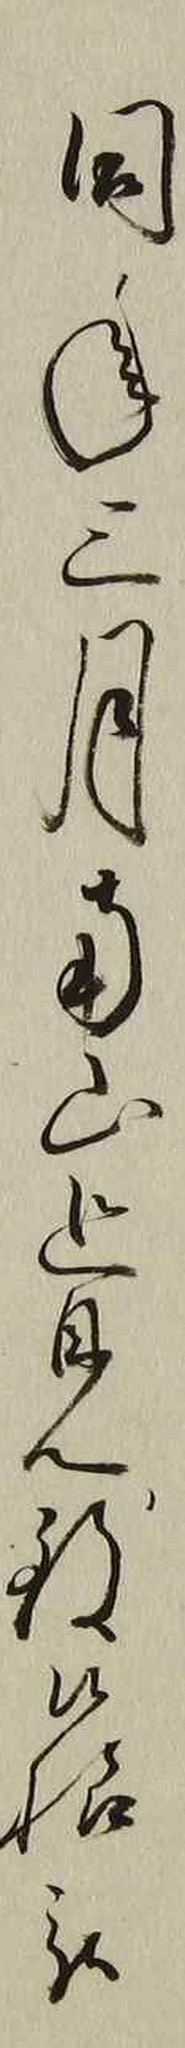一同年三月南山上見致候様被
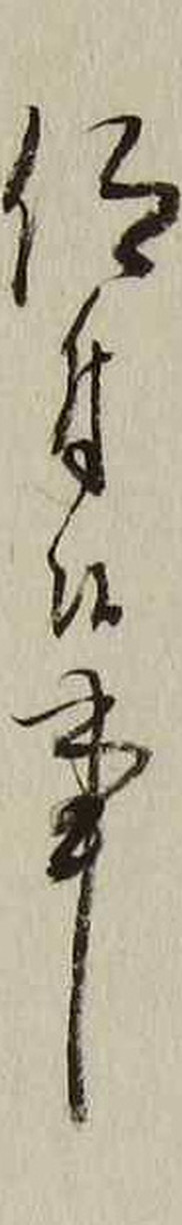仰付候事
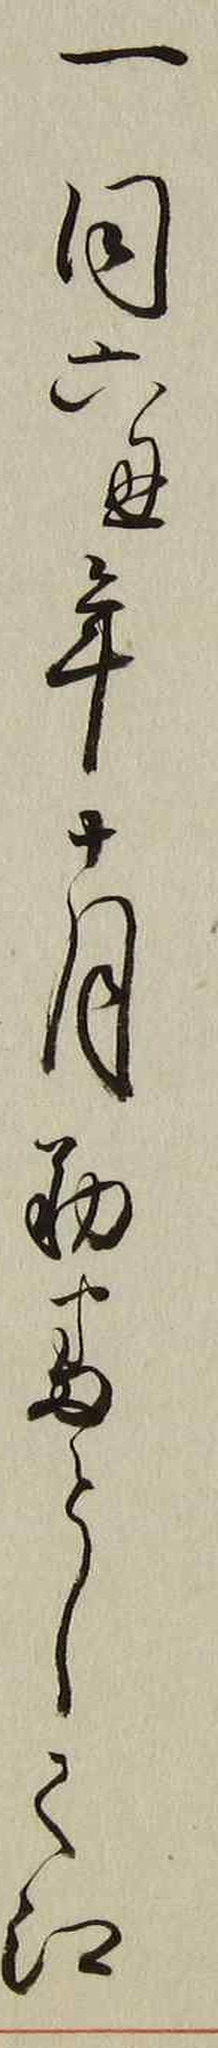一同六丑年十月勤番として江
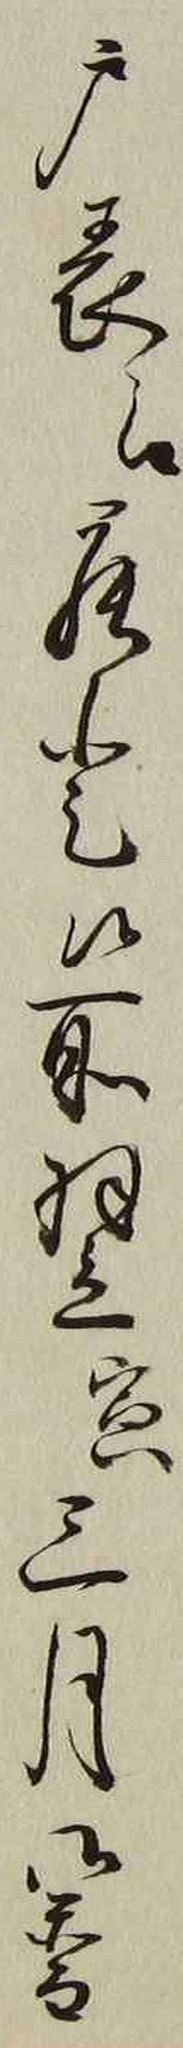戸表江罷登候所翌寅三月御普
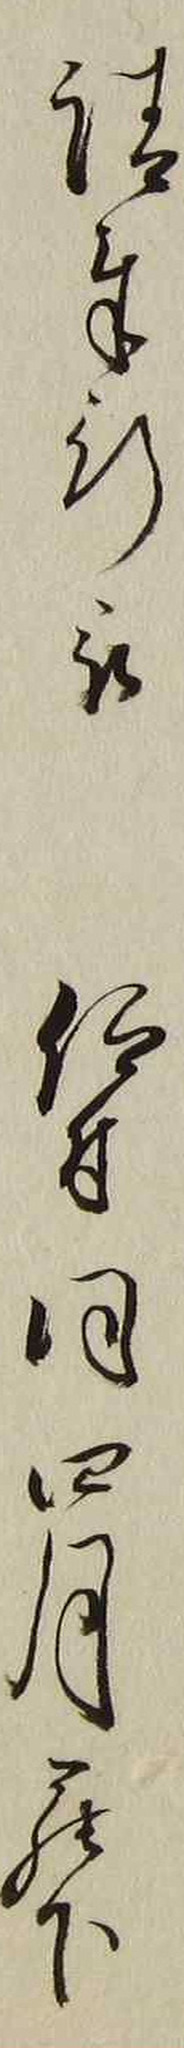請奉行被仰付同四月罷下
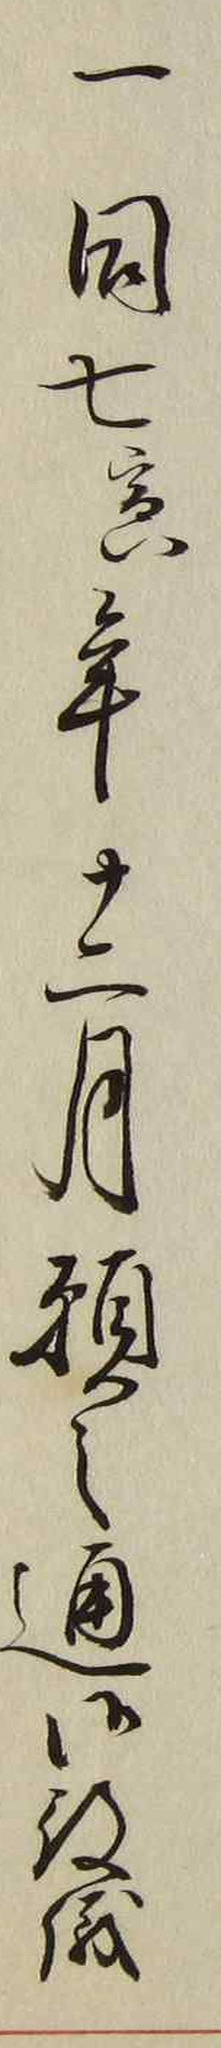一同七寅年十二月願之通御役儀

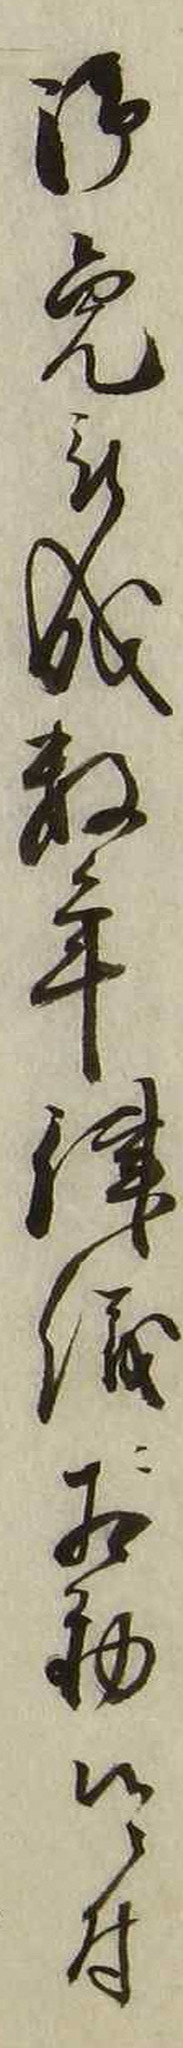御免被成数年律儀ニ相勤候ニ付
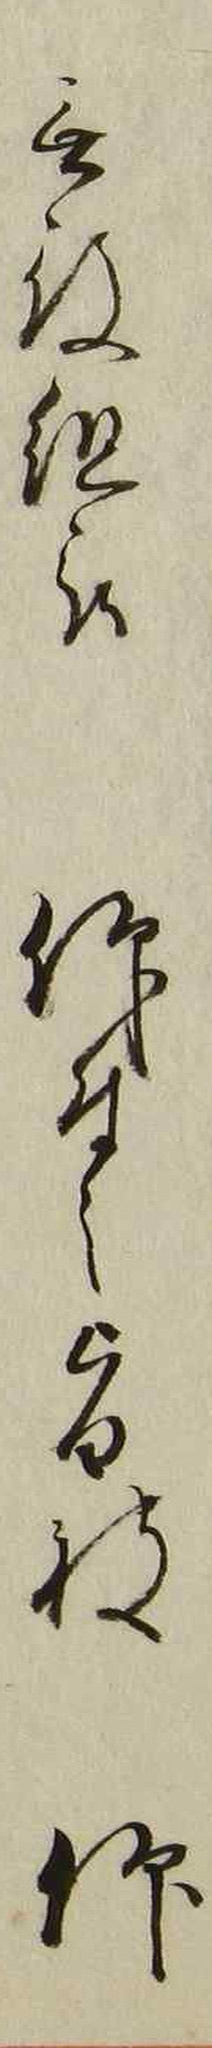無役組被仰付之旨被仰
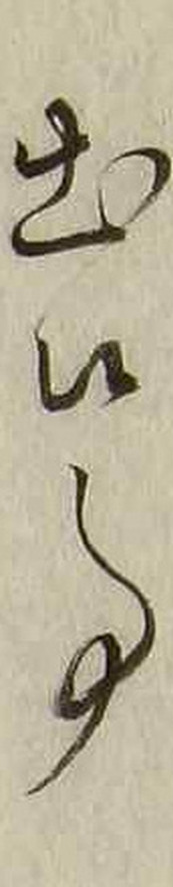出候事
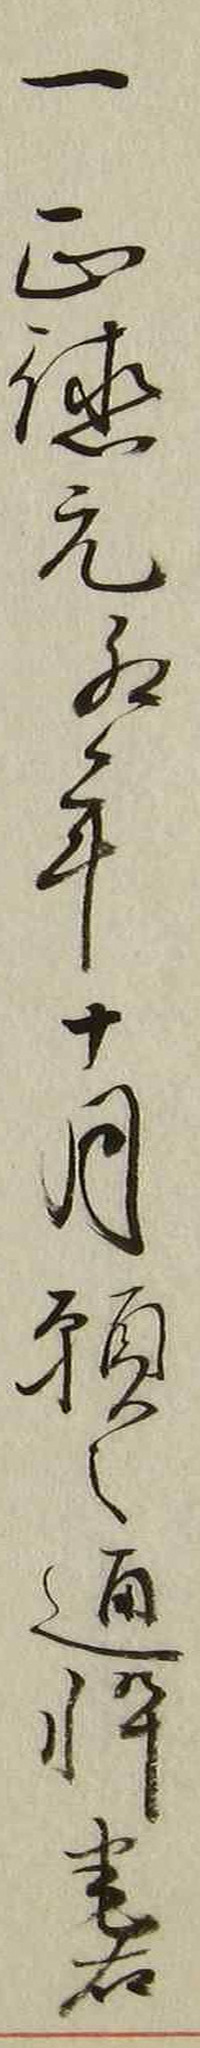一正徳元卯年十月願之通忰宅右
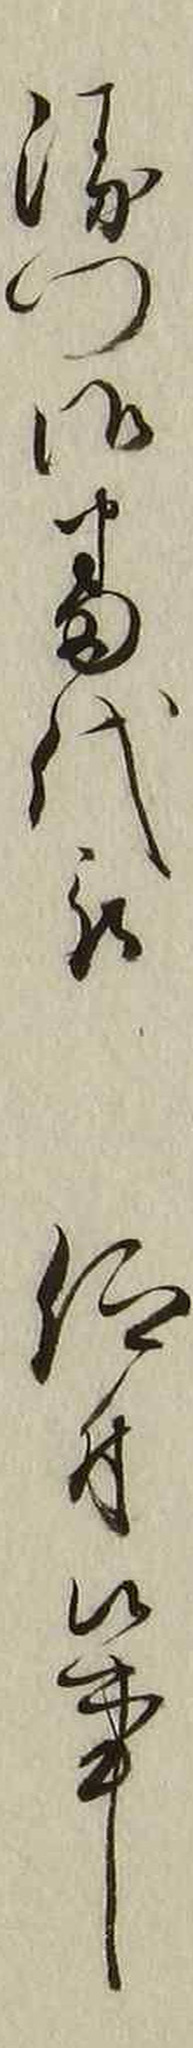衛門御番代被仰付候事
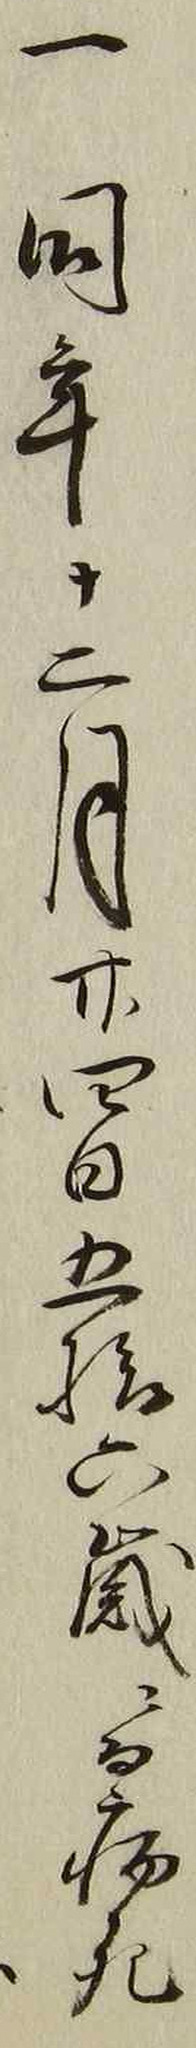一同年十二月廿四日五拾六歳ニ而病死
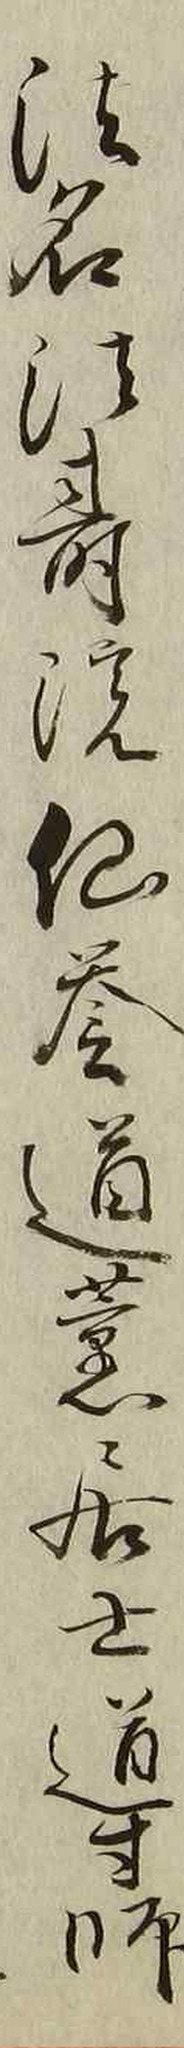法名法寿院誉道薫居士導師
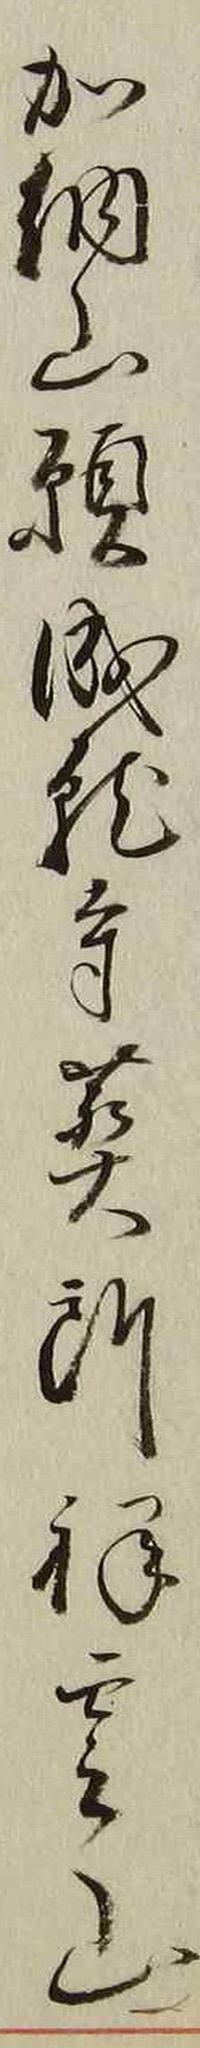加納山願成就寺葬所祥雲山
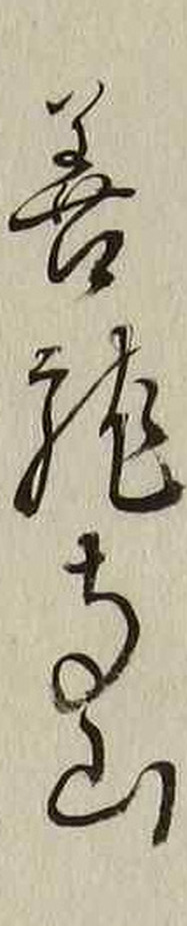善龍寺山
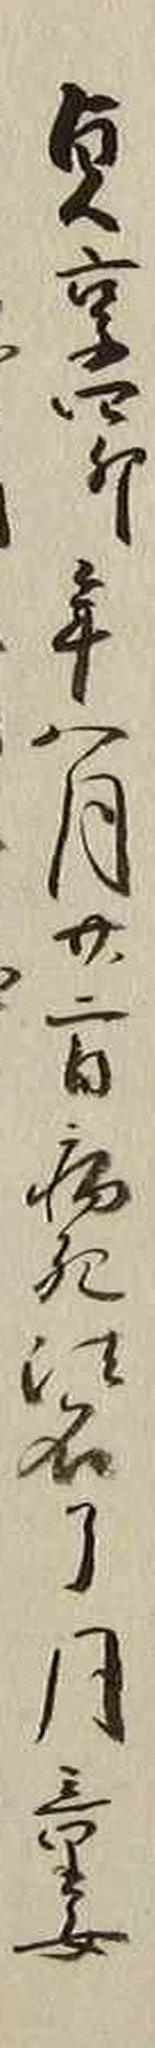女貞享四卯年八月廿二日病死法名了月童女
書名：諸士系譜　巻之2　い之部2
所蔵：会津若松市立会津図書館
